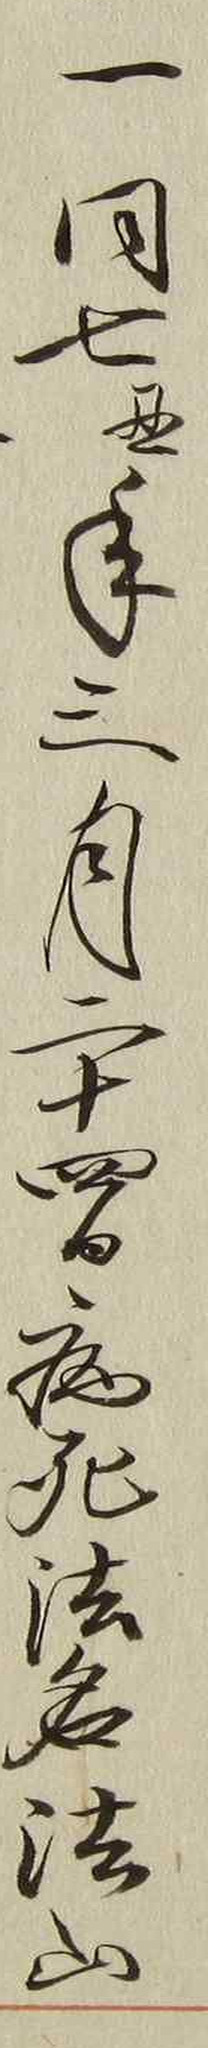一同七丑年三月二十四日病死法名法山
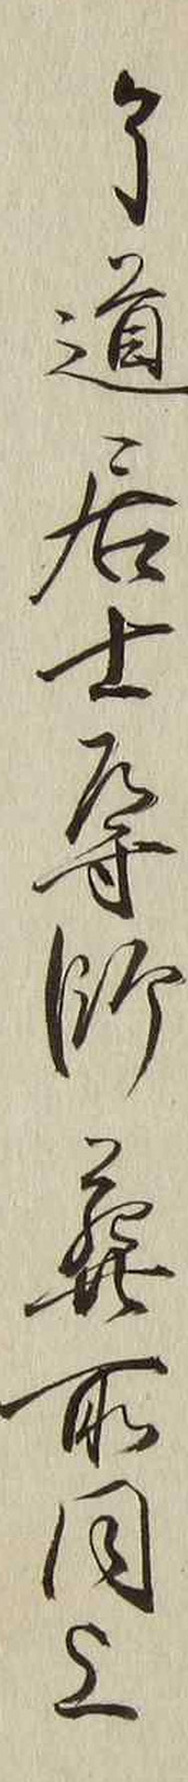了道居士導師葬所同上
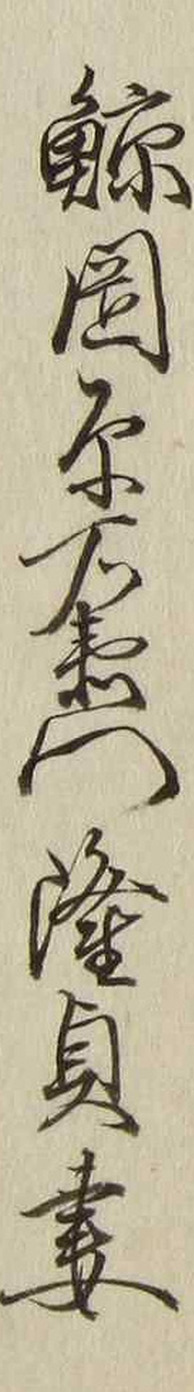女鯨岡草右衛門隆貞妻

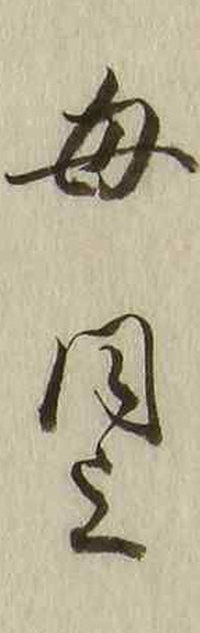母同上
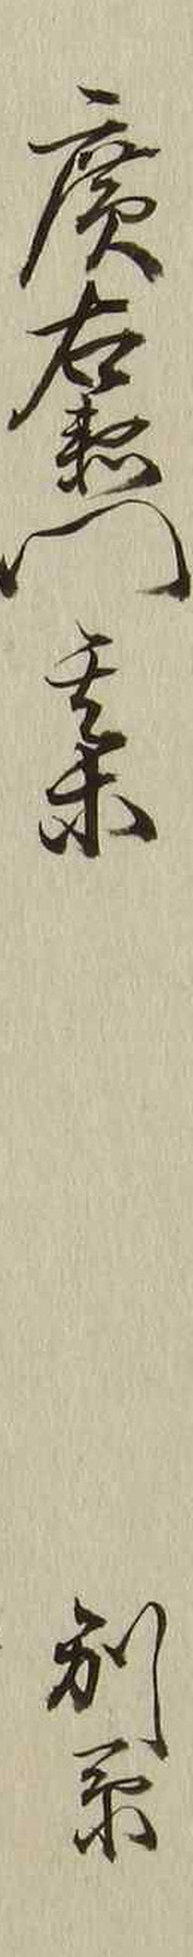広右衛門某別系
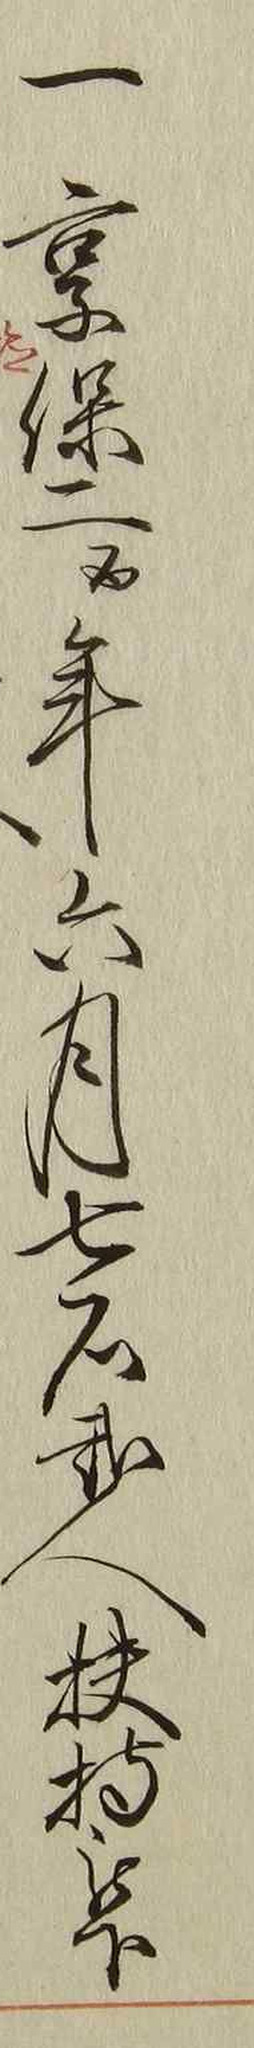一享保二酉年六月七石弐人扶持被下
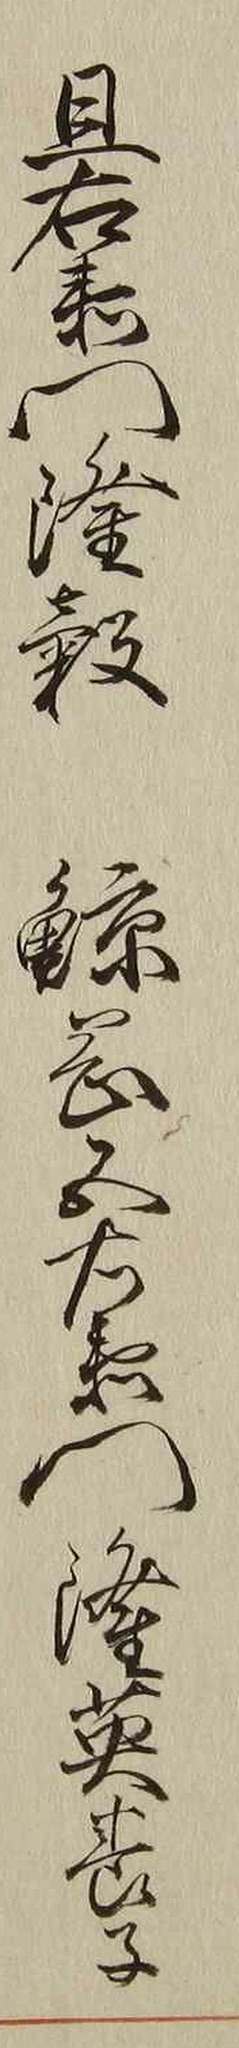且右衛門隆穀鯨岡五右衛門隆英養子
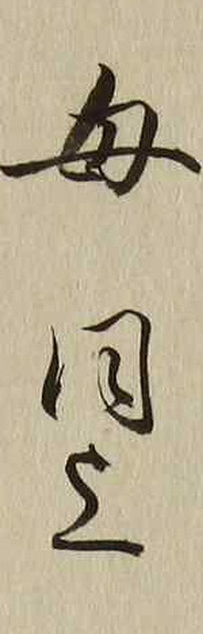母同上
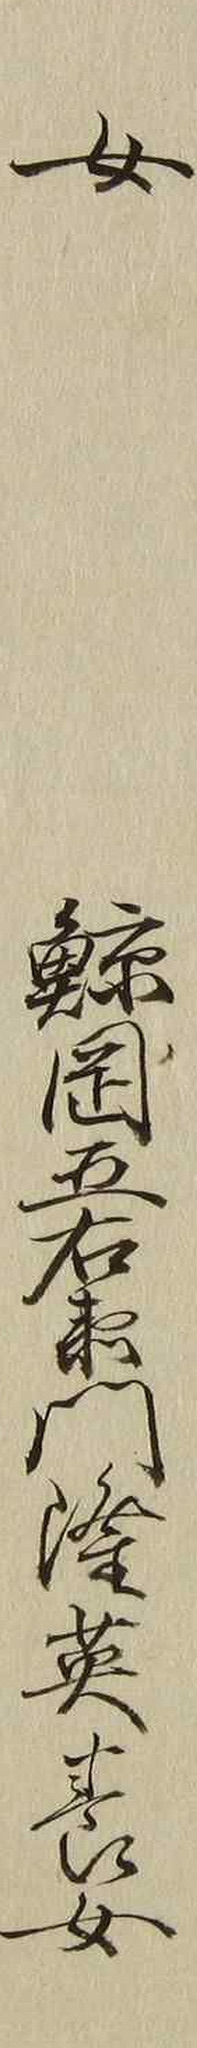女鯨岡五右衛門隆英養女
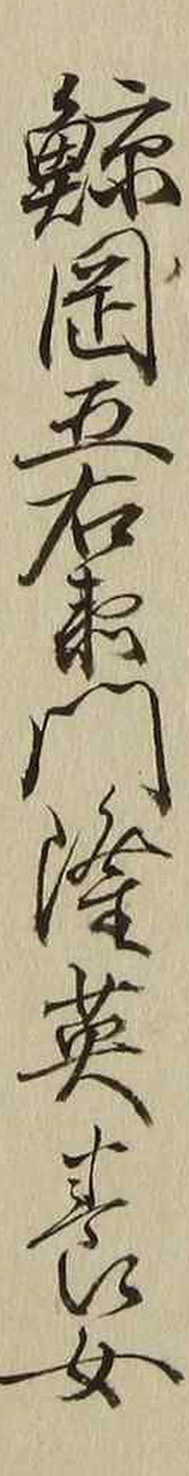女鯨岡五右衛門隆英養女
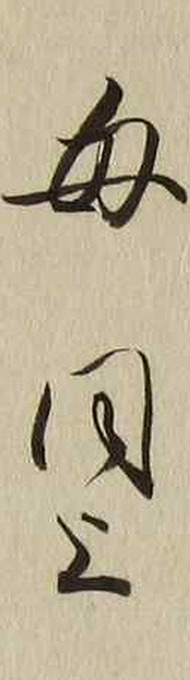母同上
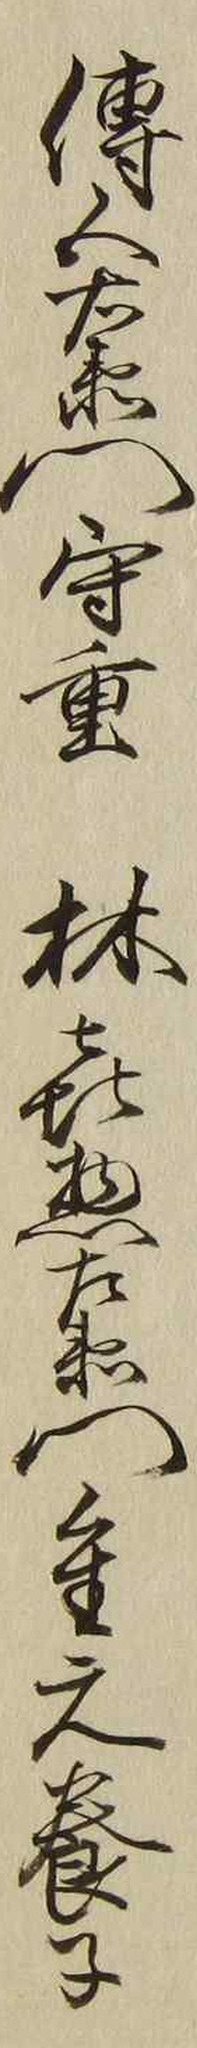伝五右衛門守重林喜惣左衛門重元養子
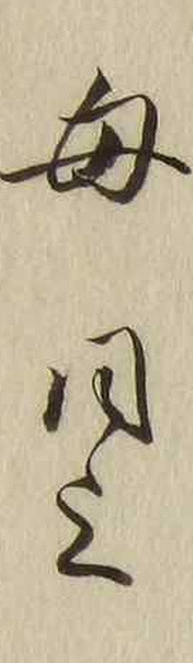母同上

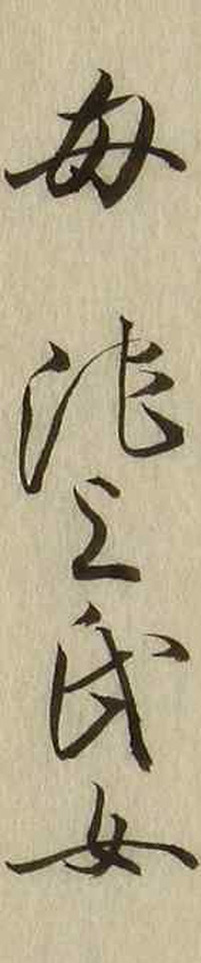母池上氏女
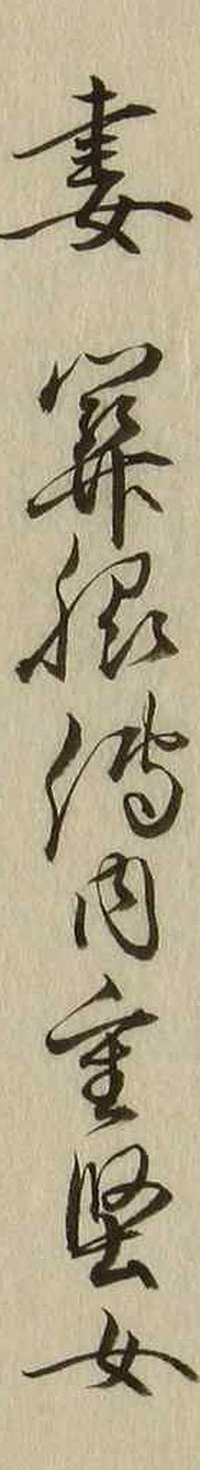妻関脇伝内重堅女
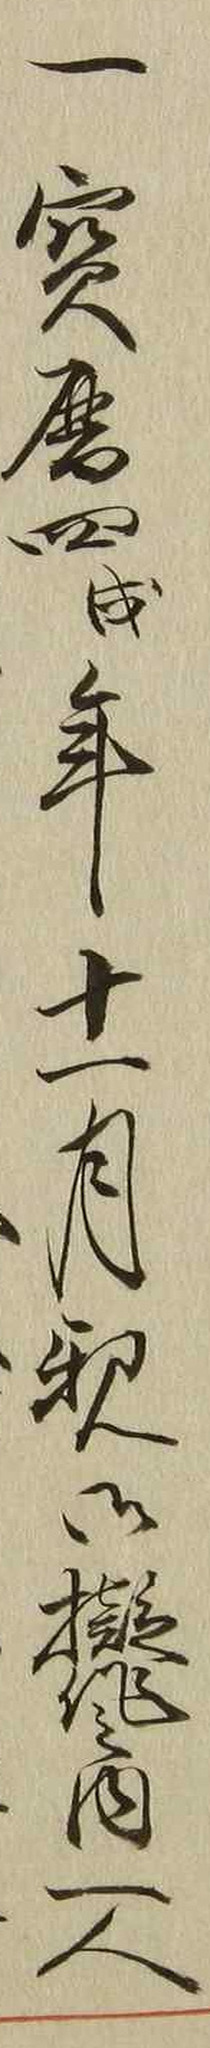一宝暦四戌年十一月親御擬作之内一人
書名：諸士系譜　巻之57　ほ之部4
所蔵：会津若松市立会津図書館
